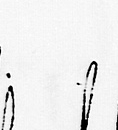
§.
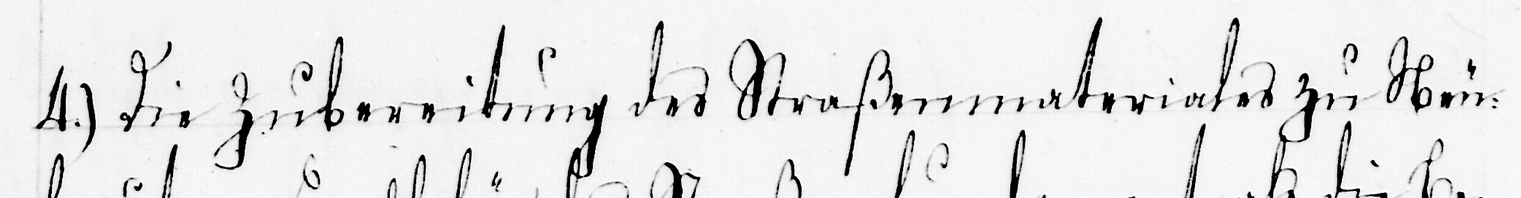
4.) Die Zubereitung des Straßenmaterials zu Neu¬
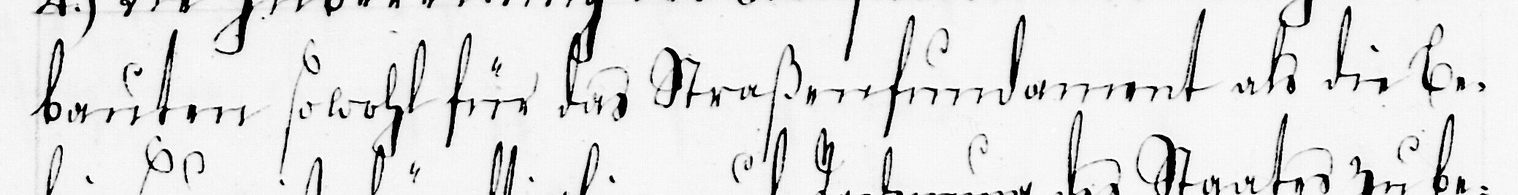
bauten sowohl für das Straßenfundament als die Be¬
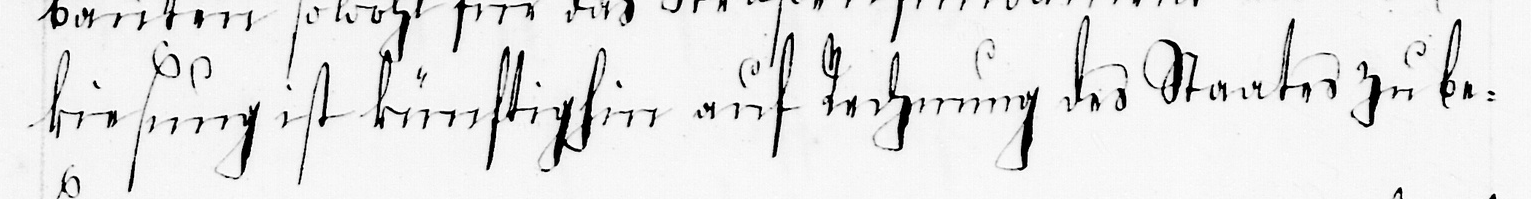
kiesung ist künftighin auf Rechnung des Staates zu be¬
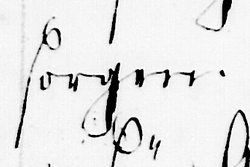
sorgen.
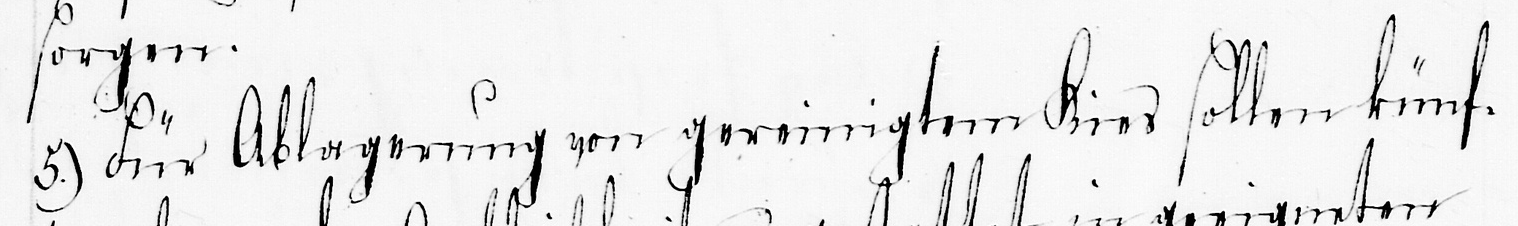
5.) Für Ablagerung von gereinigtem Kies sollen künf¬
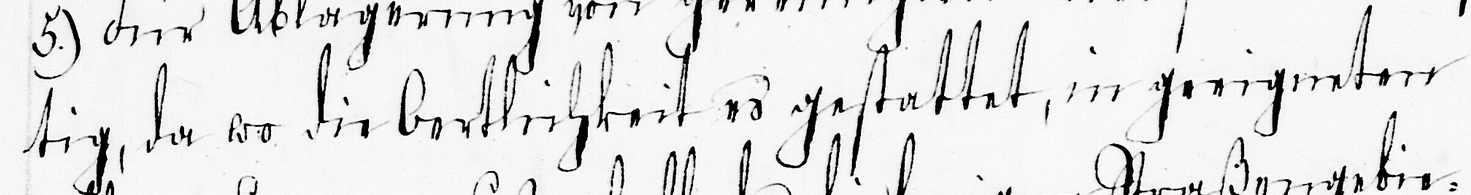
tig, da wo die Oertlichkeit es gestattet, in geeigneten
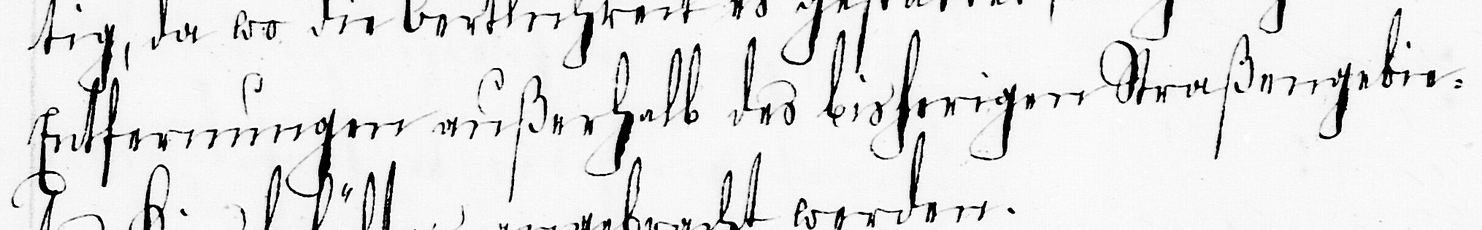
Entfernungen außerhalb des bisherigen Straßengebie¬
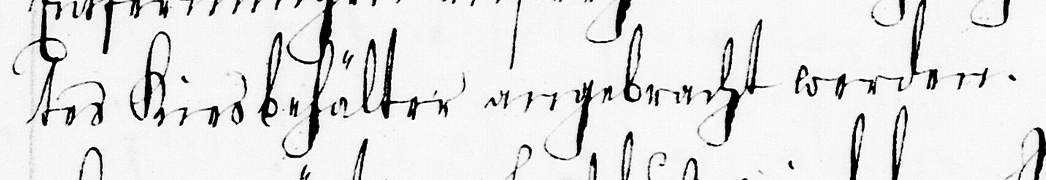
tes Kiesbehälter angebracht werden.
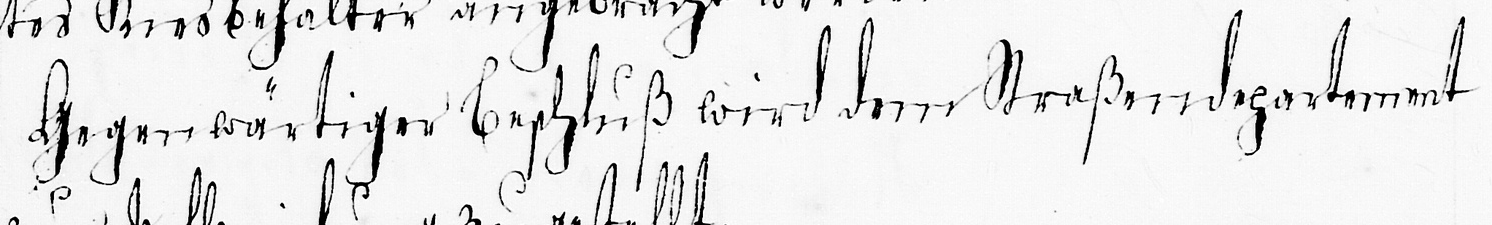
Gegenwärtiger Beschluß wird dem Straßendepartement
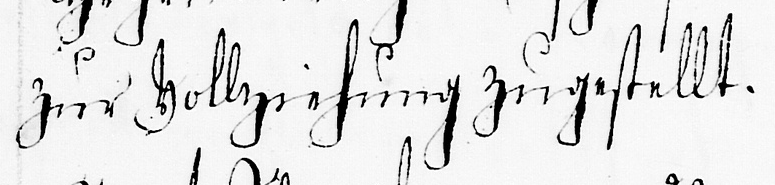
zur Vollziehung zugestellt.
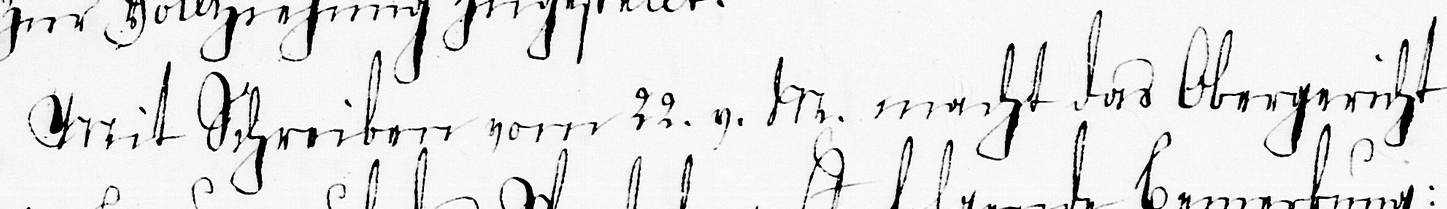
Mit Schreiben vom 22. v. M. macht das Obergericht
